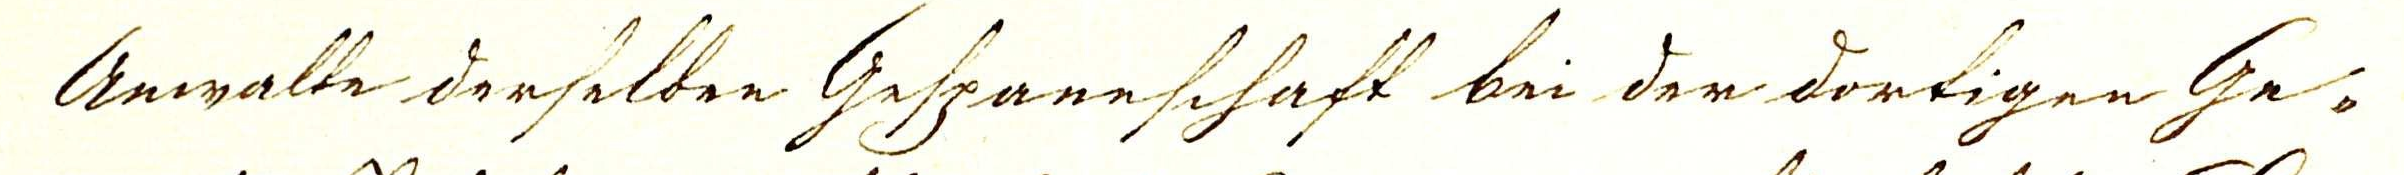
Anwalte derselben Gespannschaft bei der dortigen Ge¬
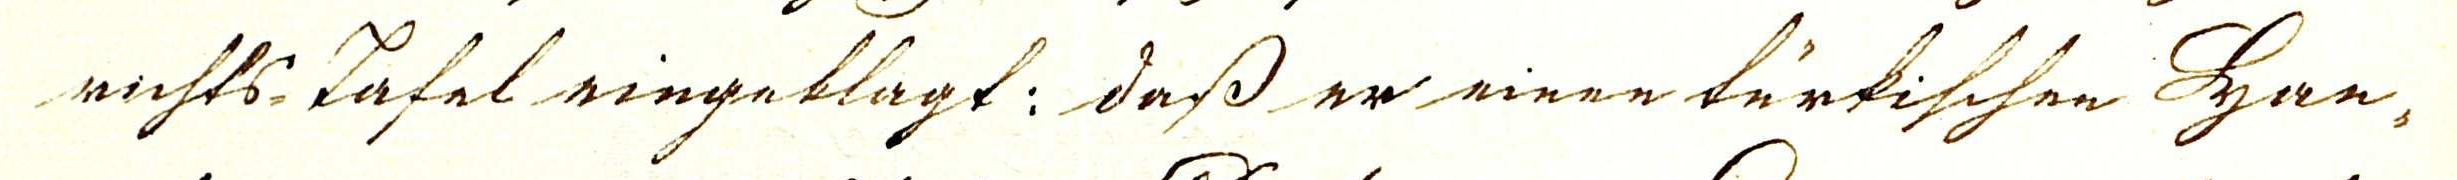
richts-Tafel eingeklagt: daß er einen türkischen Han¬
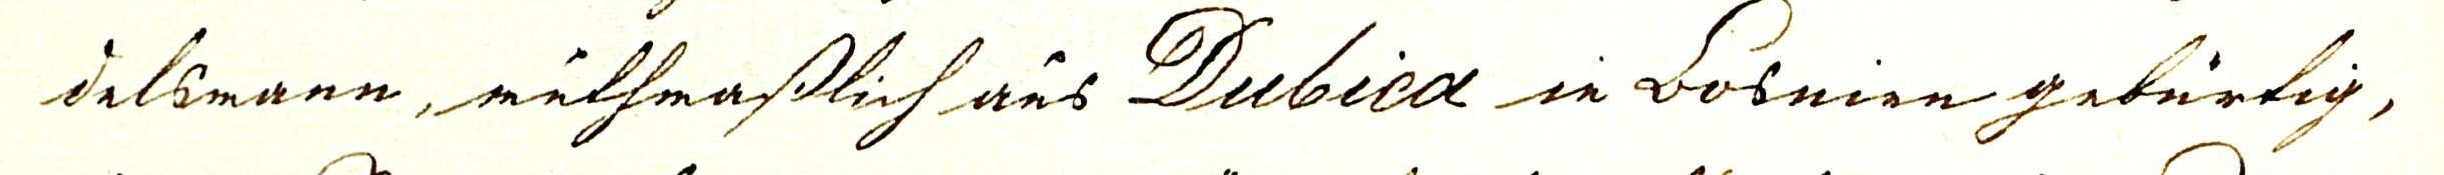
delsmann, müthmaßlich aus Dubica in Bosnien gebürtig,
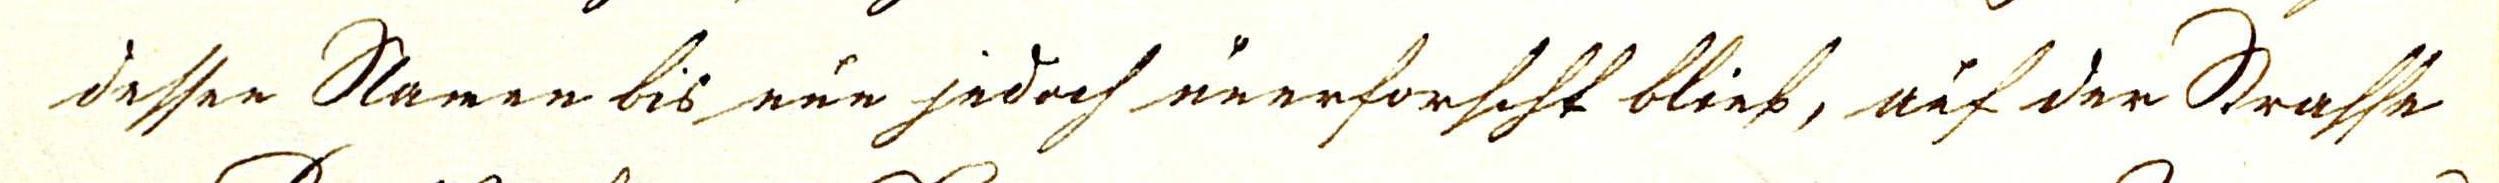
dessen Namen bis nun jedoch unerforscht blieb, auf der Strasse
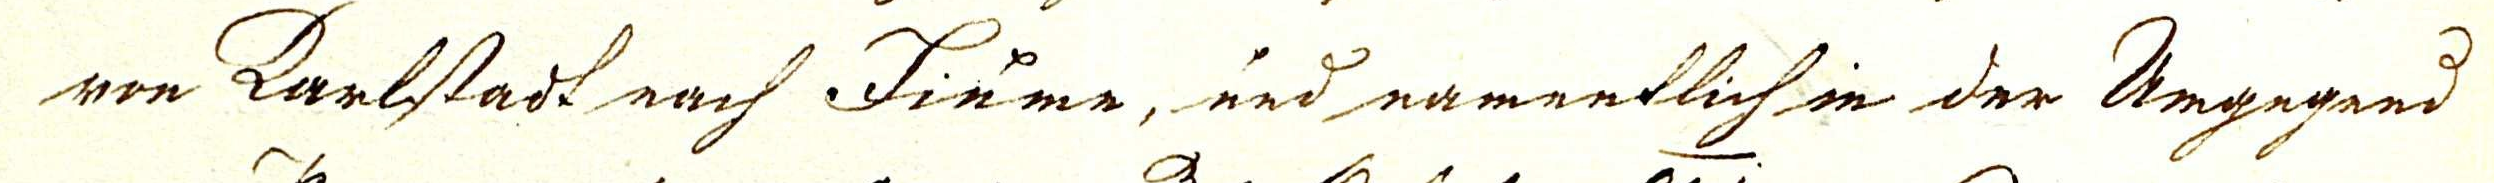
von Karlstadt nach Fiume, und namentlich in der Umgegend
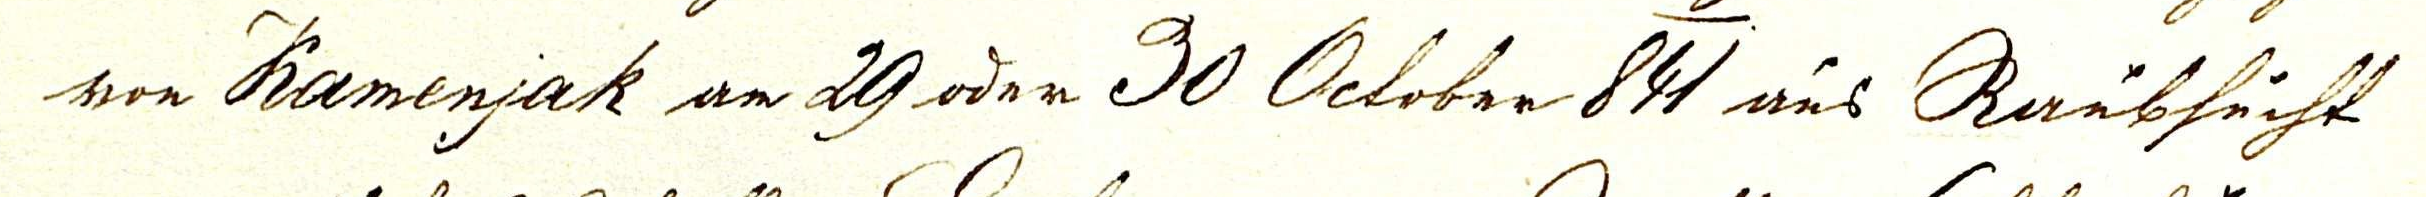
von Kamenjak am 28 oder 30 October 841 aus Raubsucht
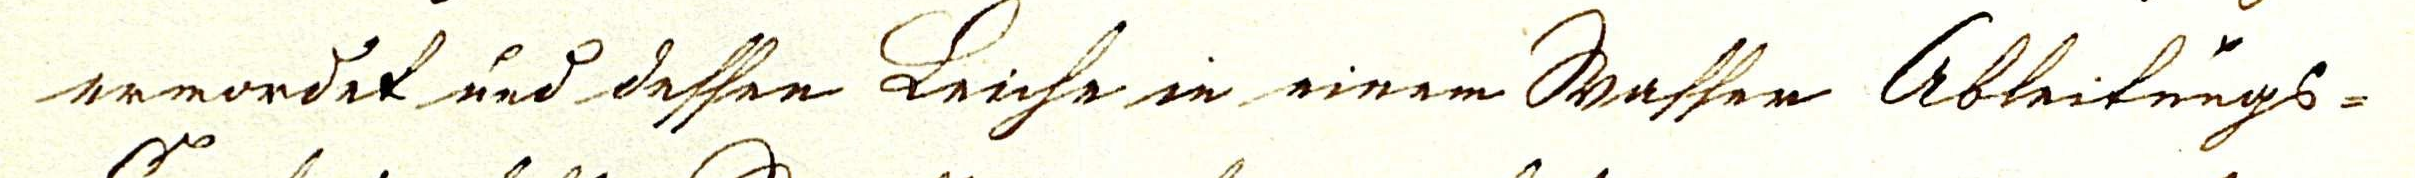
ermordet und dessen Leiche in einem Wasser Ableitungs¬
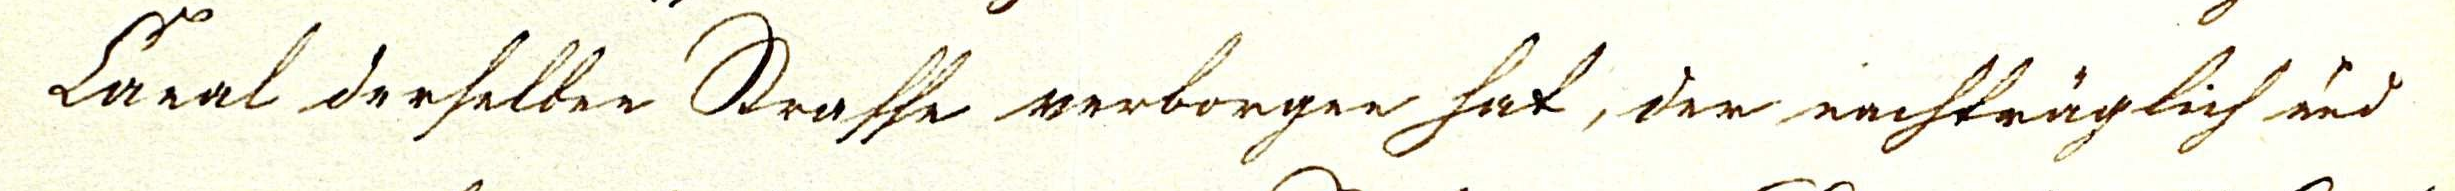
Canal derselben Strasse verborgen hat, der nachträglich und
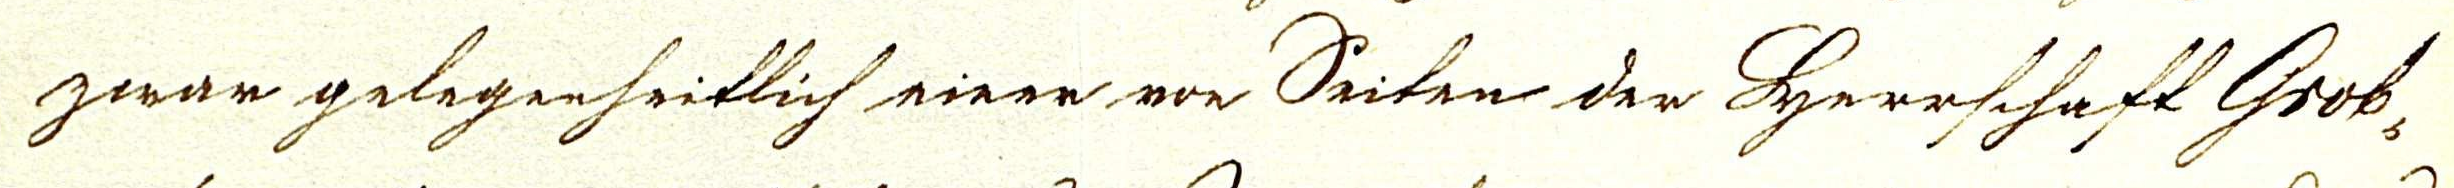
zwar gelegenheitlich einer von Seiten der Herrschaft Grob¬
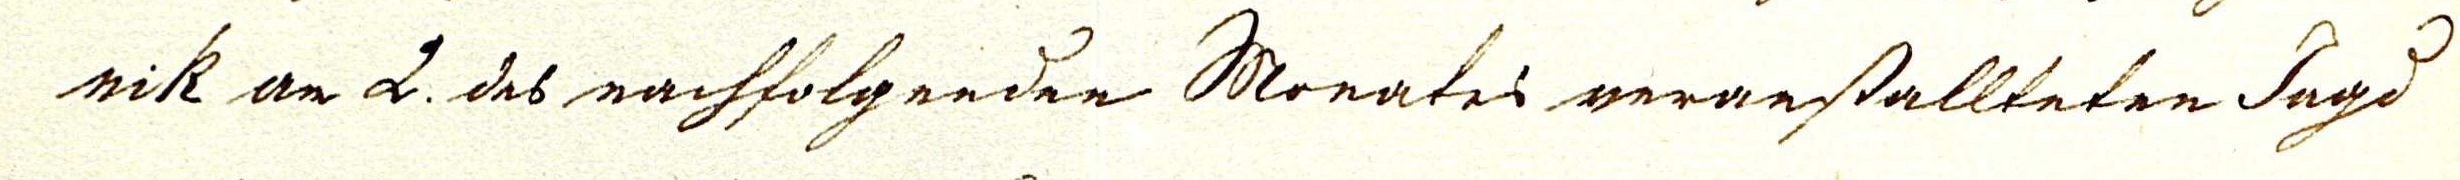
nik am 2. des nachfolgenden Monates veranstalteten Jagd
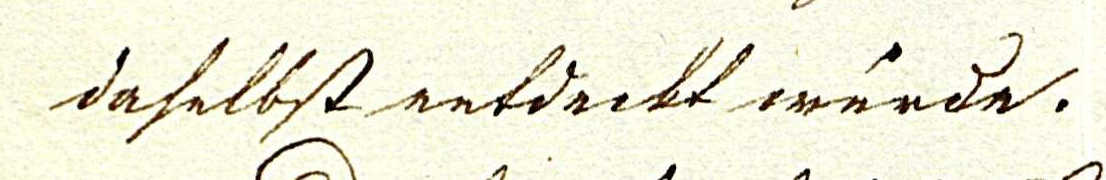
daselbst entdeckt wurde.
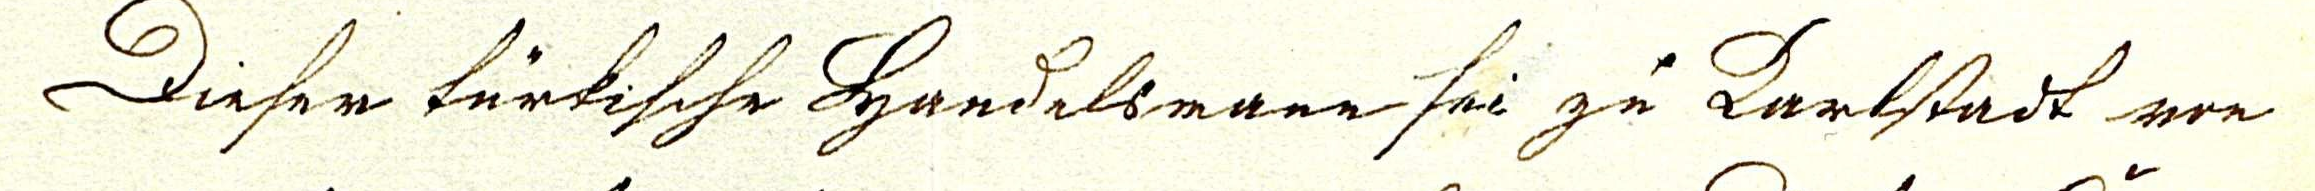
Dieser türkische Handelsmann sei zu Carlstadt (Karlovac) von
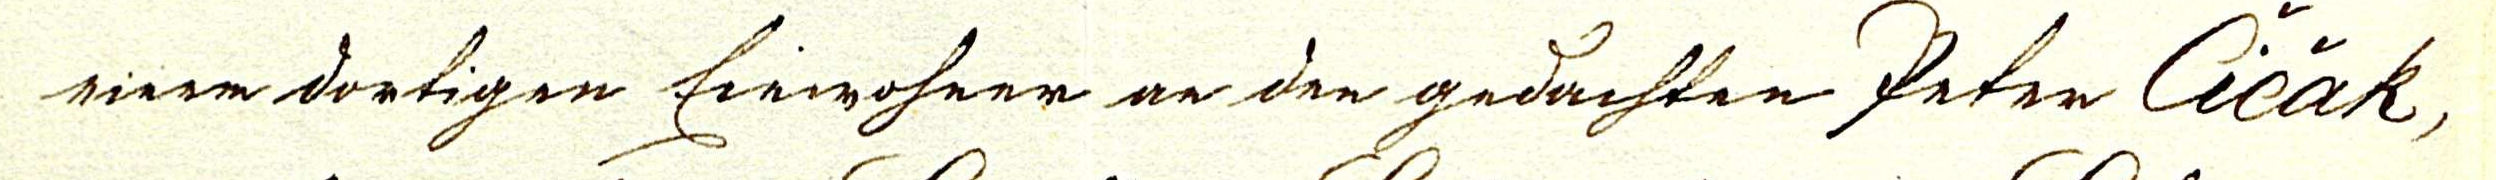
einem dortigen Einwohner an den gedachten Peter Čičak,
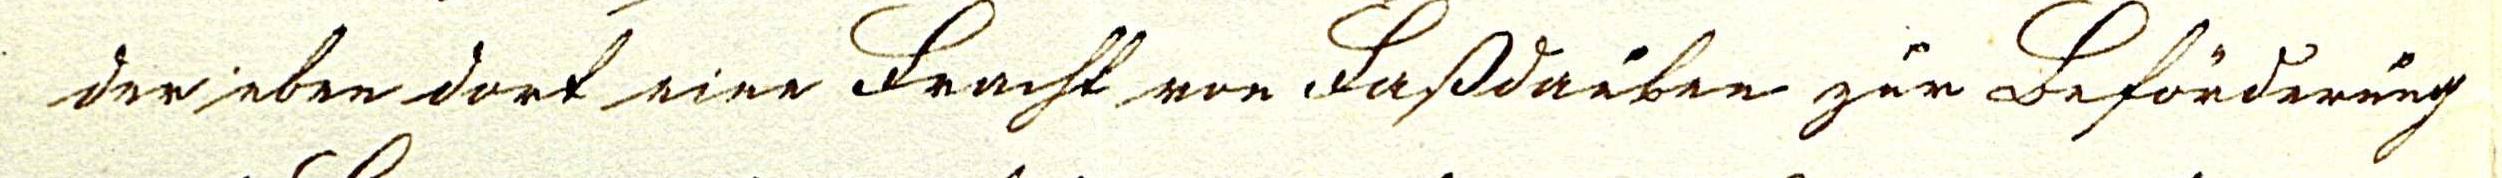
der eben dort eine Fracht von Faßdauben zur Beförderung
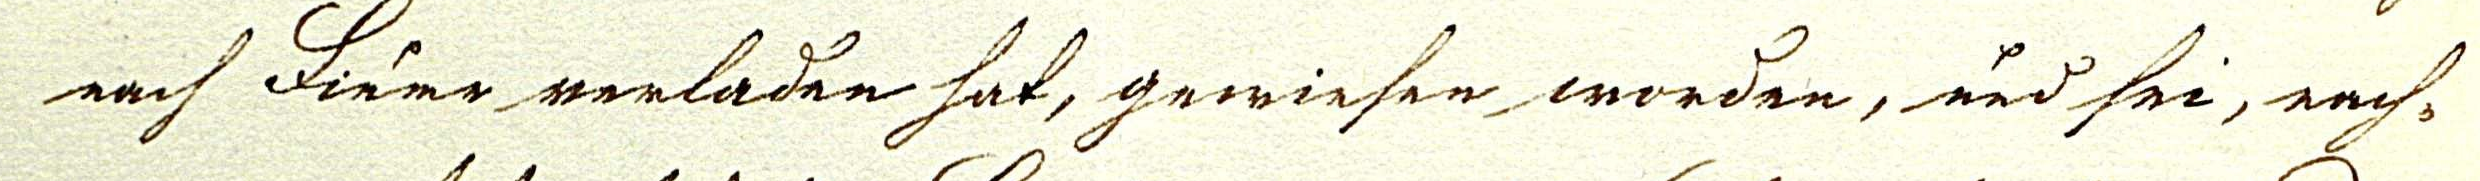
nach Fiume verladen hat, gewiesen worden, und sei, nach¬
